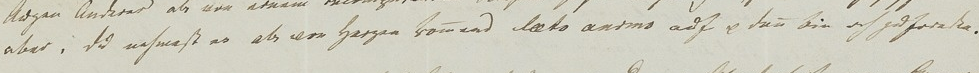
aber, Du nehmest es als von Herzen kommend laeto animo auf & dann bin ich zufrieden.
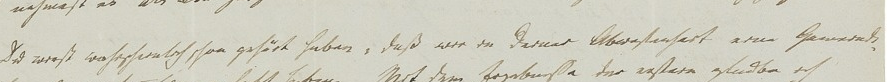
Du wirst wahrscheinlich schon gehört haben, daß wir in Deiner Abwesenheit eine Gemeinde-
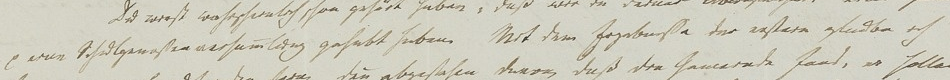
& eine Schulgenossenversammlung gehabt haben. Mit dem Ergebnisse der erstern glaube ich
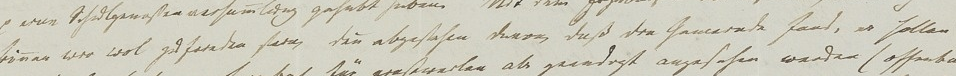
können wir wol zufrieden sein, denn abgehen davon, daß die Gemeinde fand, es sollen
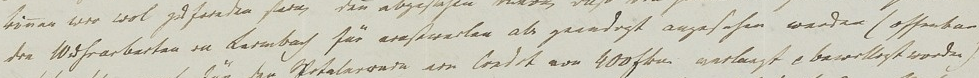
die Wuhrarbeiten in Leimbach für einstweilen als geendigt angesehen werden (offenbar
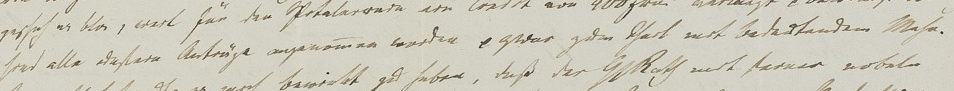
sind alle unsere Anträge angenommen worden & zwar zum Theil mit bedeutendem Mehr.
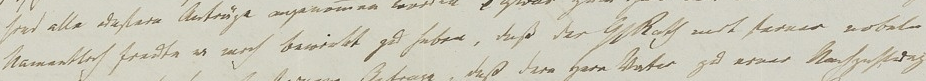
Namentlich freute es mich bewirkt zu haben, daß der G. Rath mit seiner nobeln
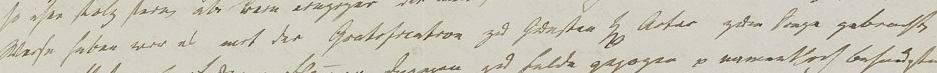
Weise haben wir es mit der Gratification zu Gunsten Herrn Arter zum Siege gebracht,
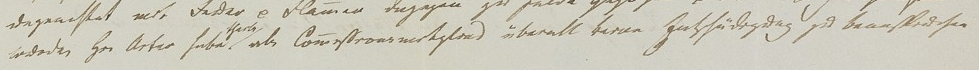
wurde, Hr. Arter habe theils als Commissionsmitglied überall keine Entschädigung zu beanspruchen
